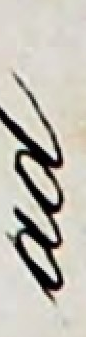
ad
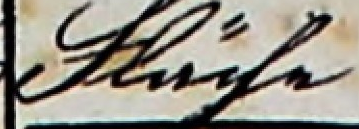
Fläche
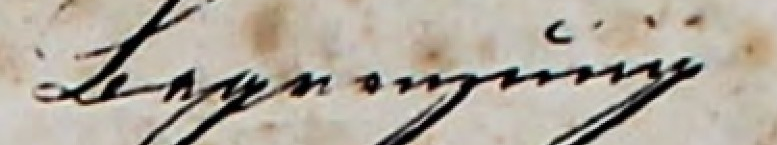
Begrenzung
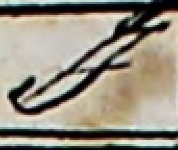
J.
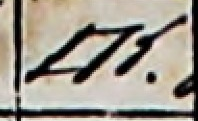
CK.
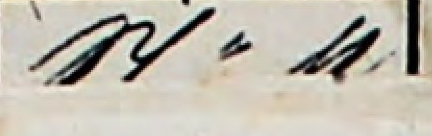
???
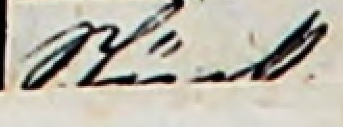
???
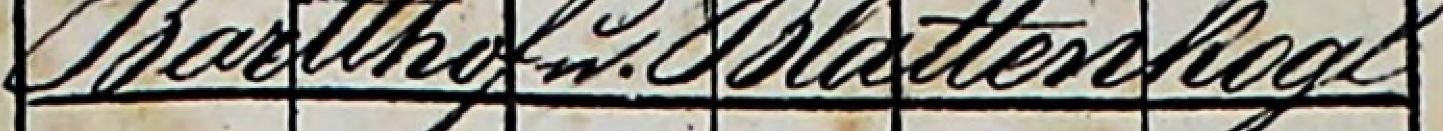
Bartthof u. Blattenkogl
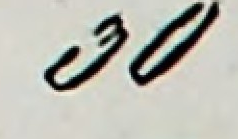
30
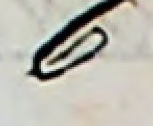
6
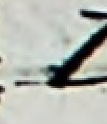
I
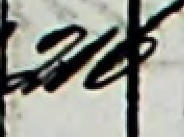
216
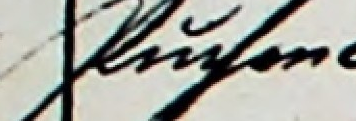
Puchen
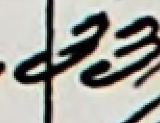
33
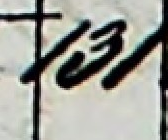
131
